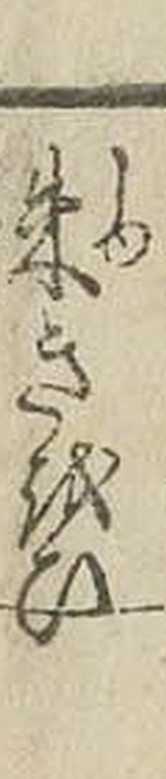朱きをひ
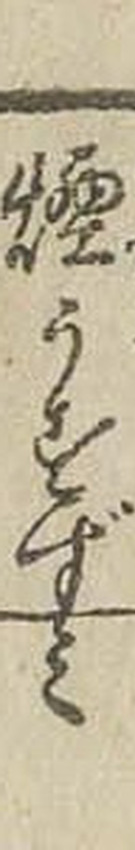煙うすずみ
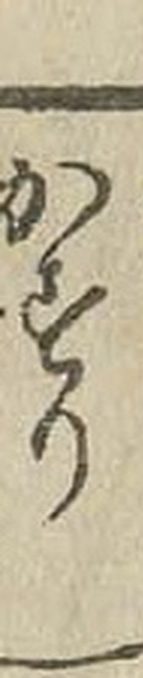かすり
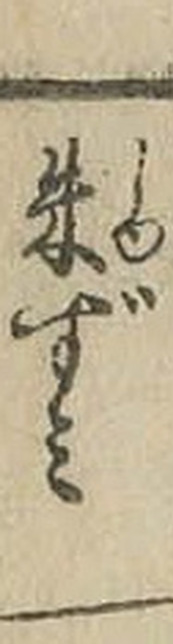朱ずみ

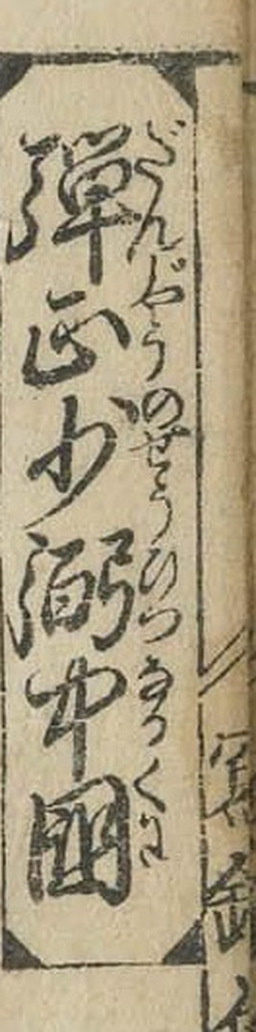弾正少弼中国
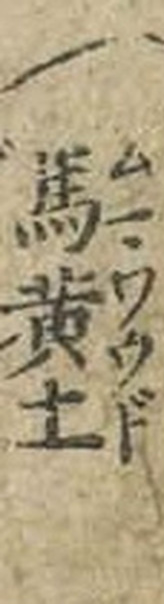馬黄土
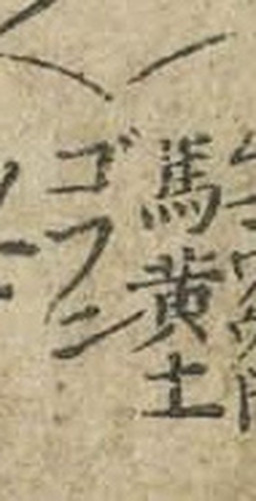ゴフン
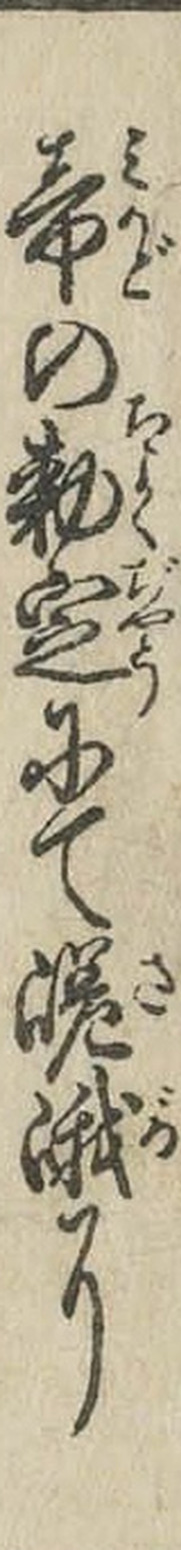帝の勅定にて嵯峨に
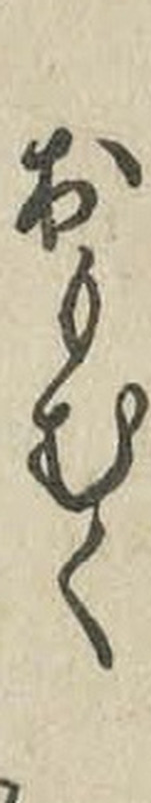おもむく
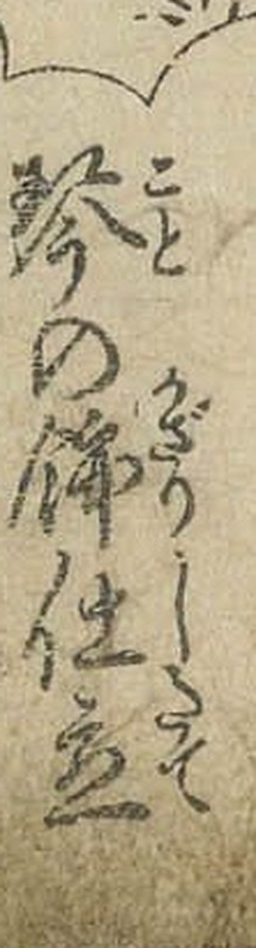琴の飾仕立
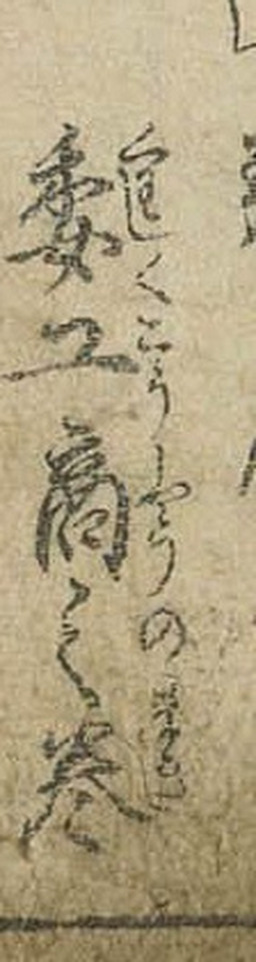委工商之巻
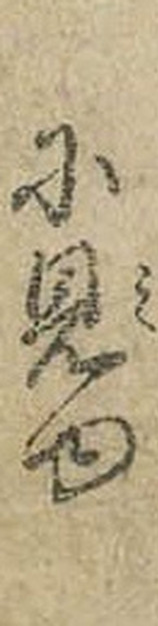に見ゆ

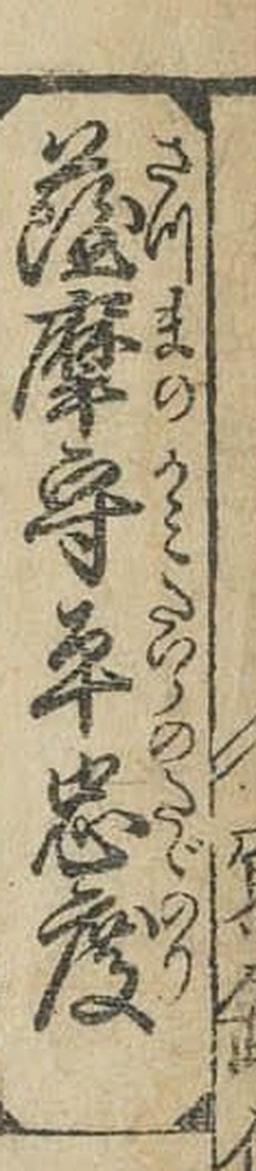薩摩守平忠度
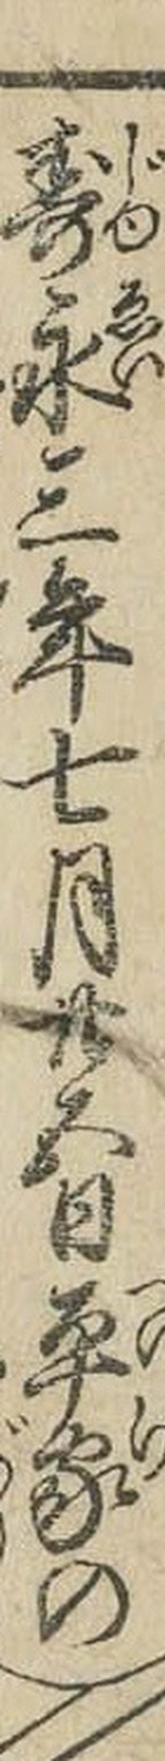寿永三年七月二五日平家の
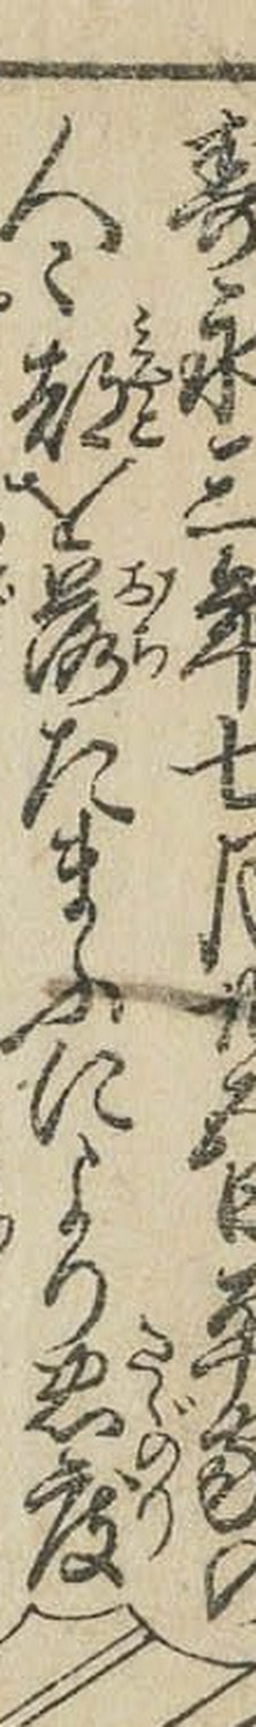人々都を落たまふにより忠度
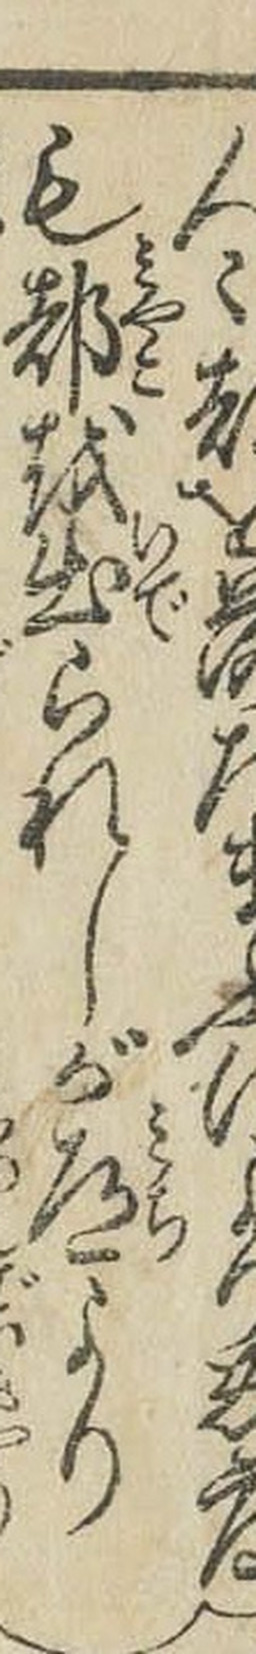も都を出られしが道より
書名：絵本写宝袋 9巻 1之巻
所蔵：東京学芸大学教育コンテンツアーカイブ
